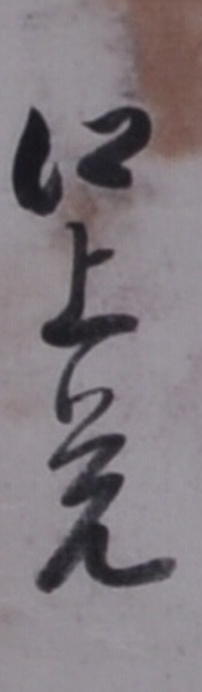口上覚
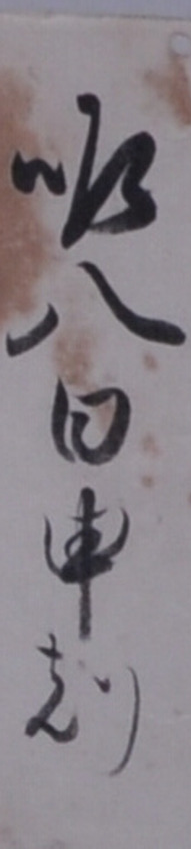昨八日申刻
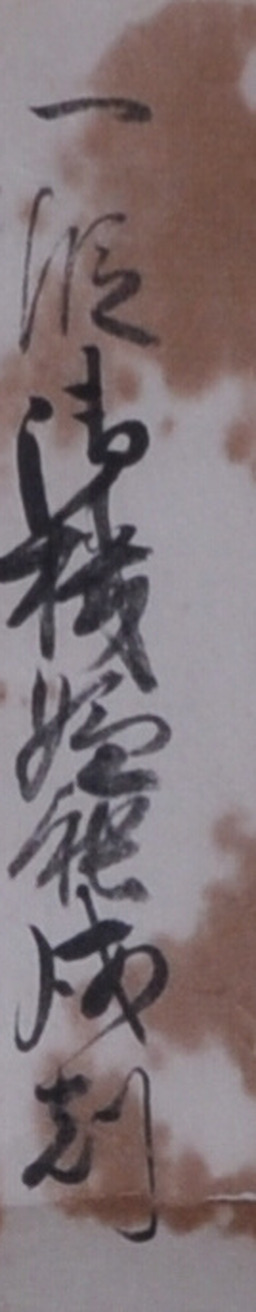一段御機嫌能戌刻
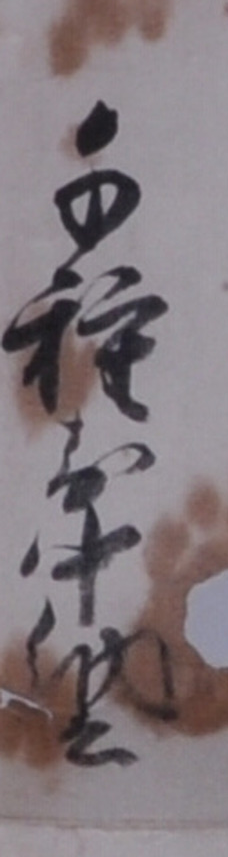千種前中納言
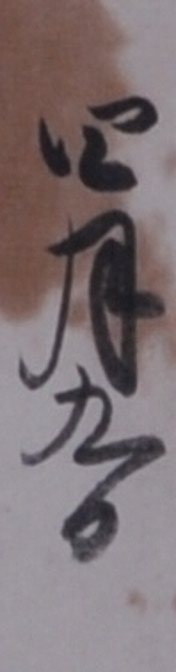四月九日
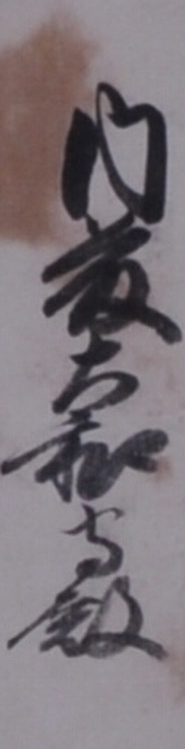内藤大和守殿
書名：口上覚
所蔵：伊那市立高遠町図書館・合同会社AMANE
